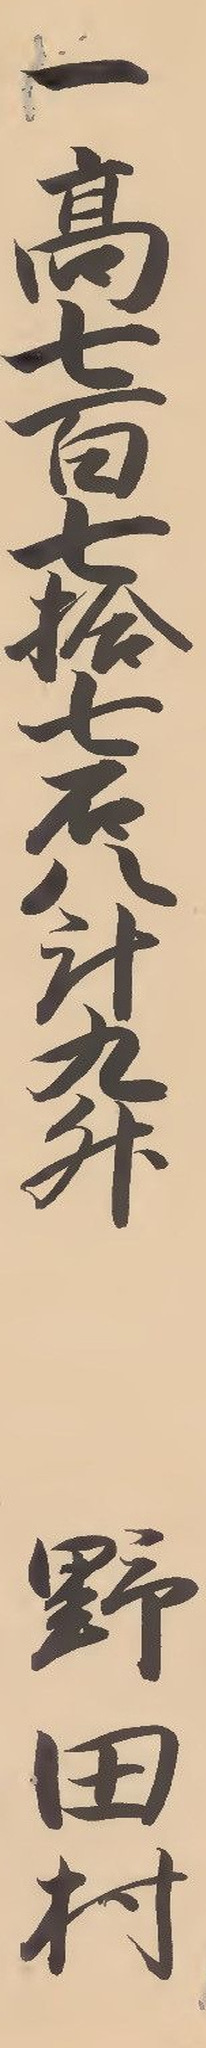一高七百七拾七石八斗九升野田村
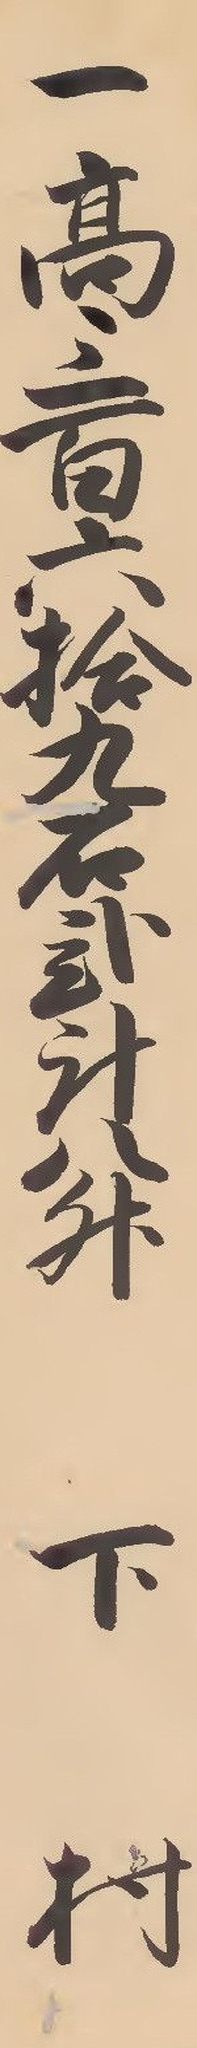一高三百六拾九石弐斗八升下村

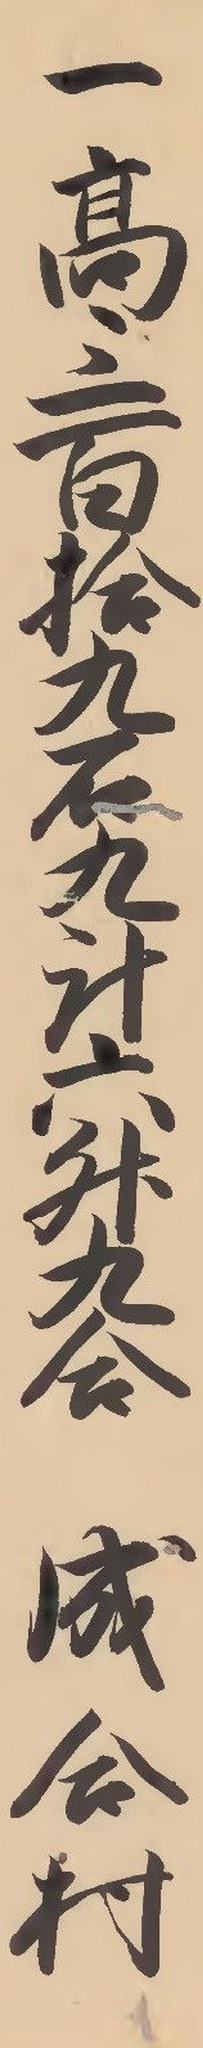一高三百拾九石九斗六升九合成合村
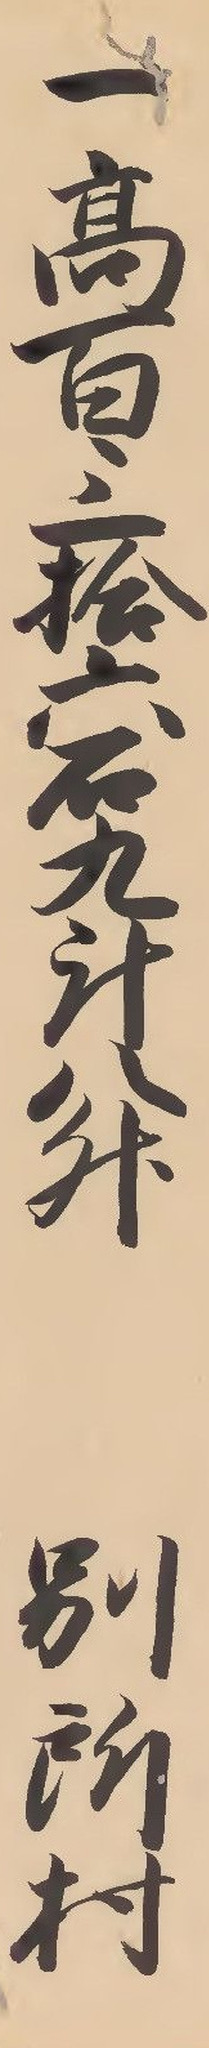一高百三拾六石九斗八升別所村
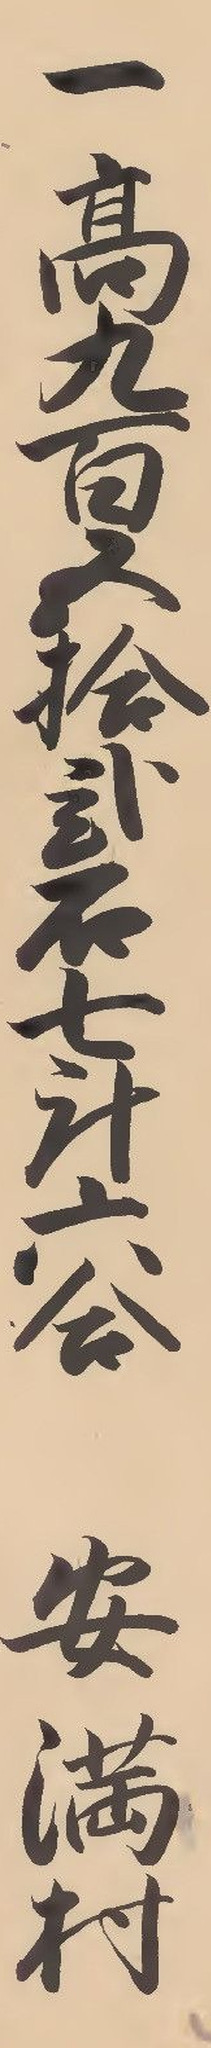一高九百五拾弐石七斗六合安満村
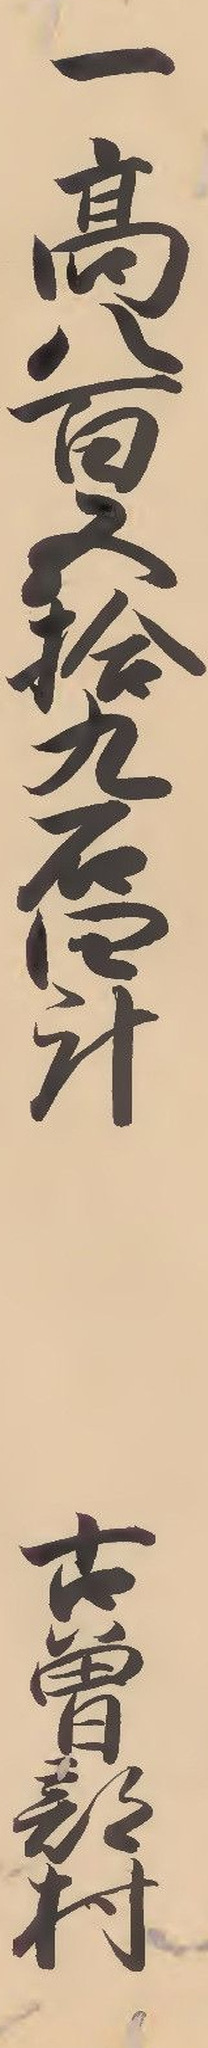一高八百五拾九石四斗古曽部村
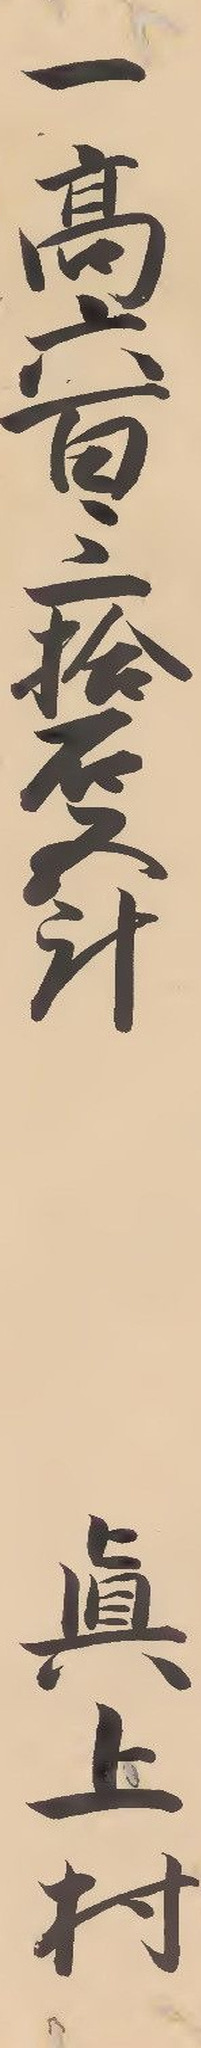一高六百三拾石五斗真上村
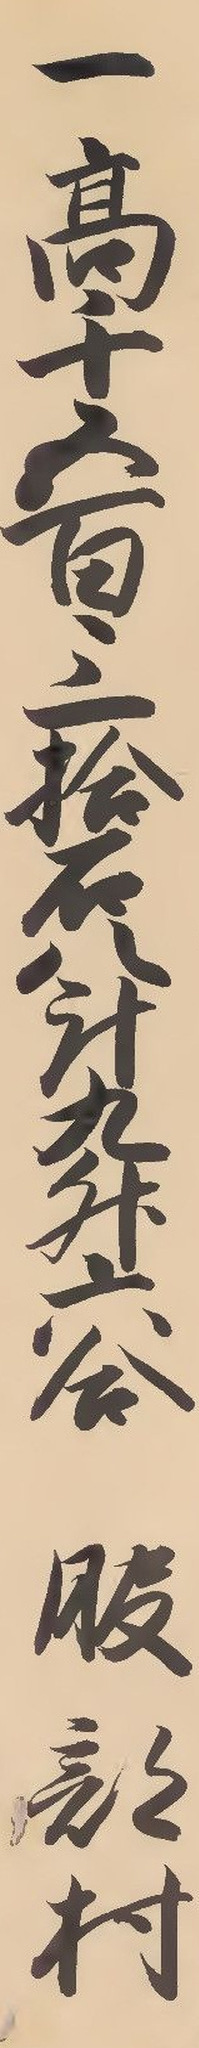一高千五百三拾石八斗九升六合服部村
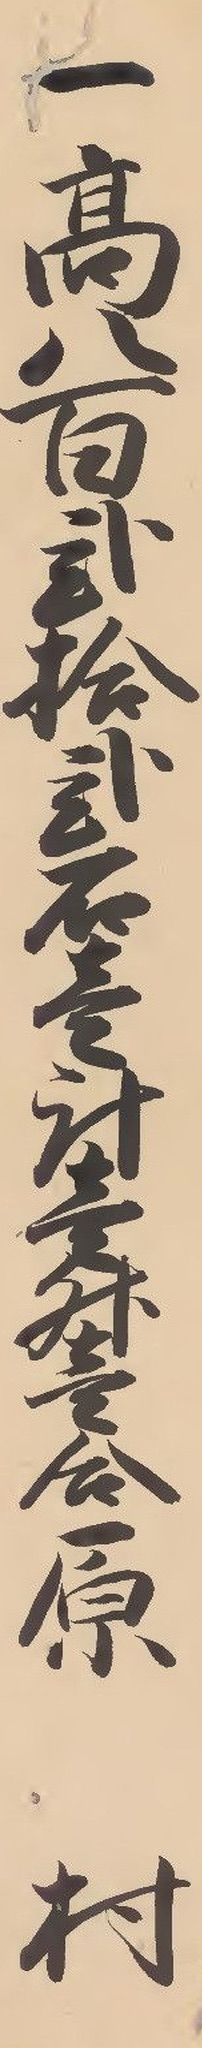一高八百弐拾弐石壱斗壱升壱合原村
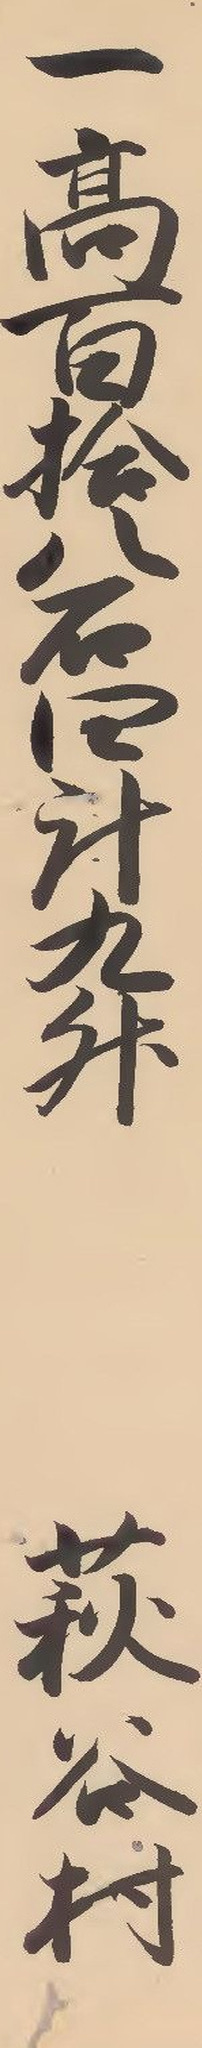一高百拾八石四斗九升萩谷村

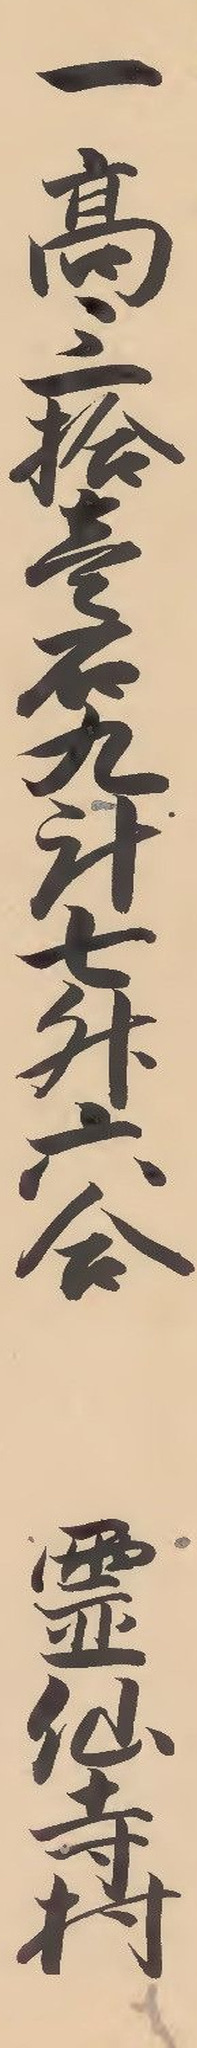一高三拾壱石九斗七升六合霊仙寺村
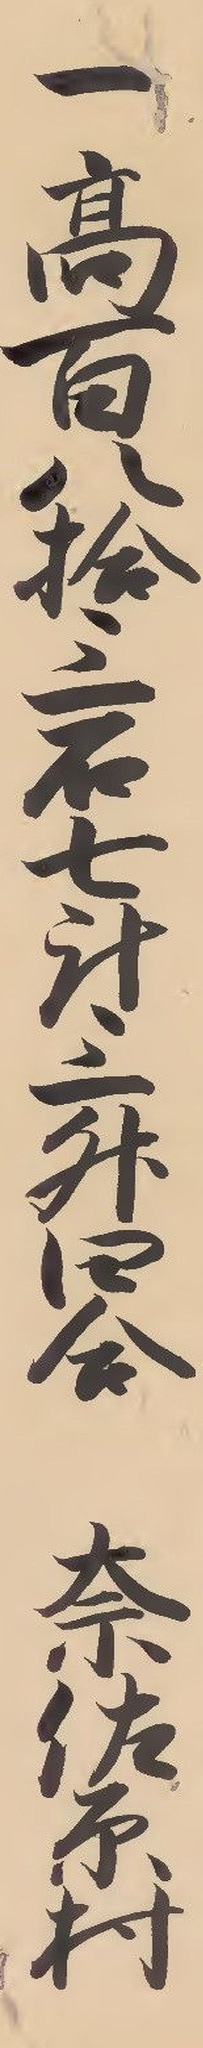一高百八拾三石七斗三升四合奈佐原村
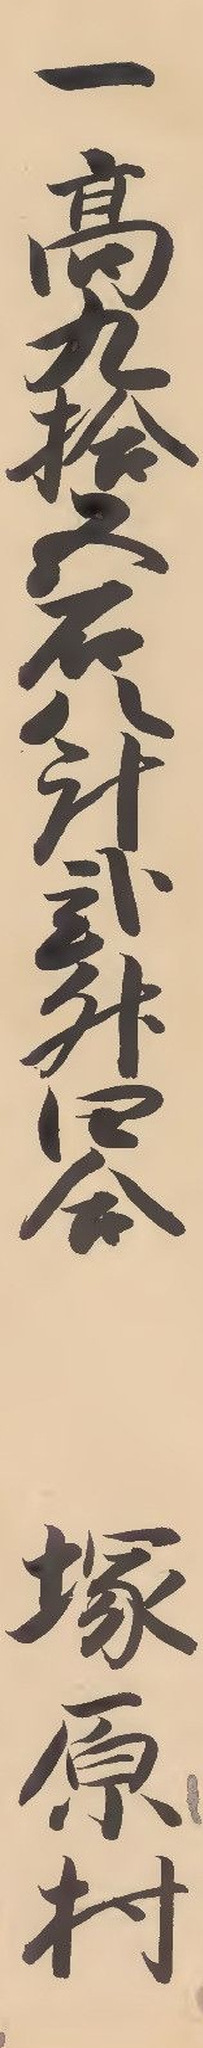一高九拾五石八斗弐升四合塚原村
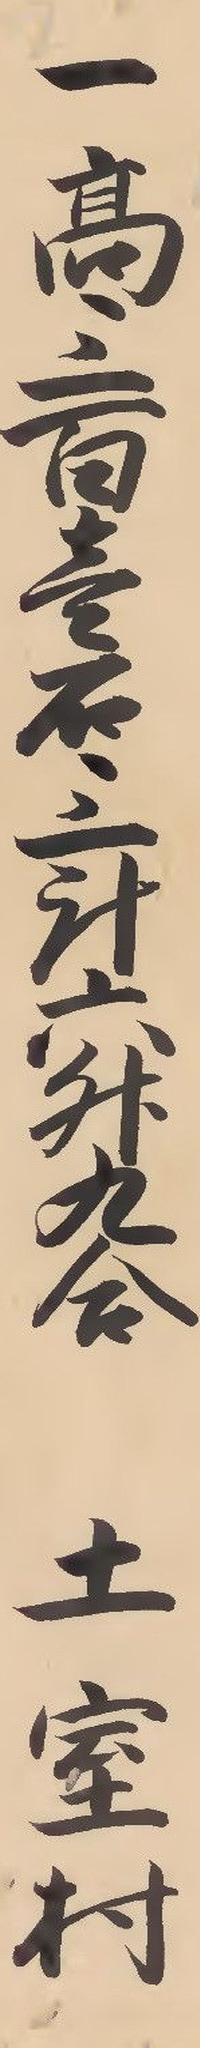一高三百壱石三斗六升九合土室村
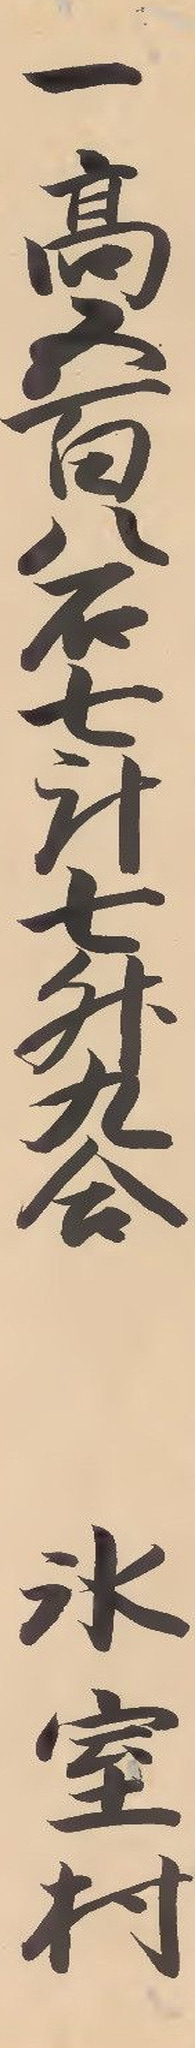一高五百八石七斗七升九合氷室村
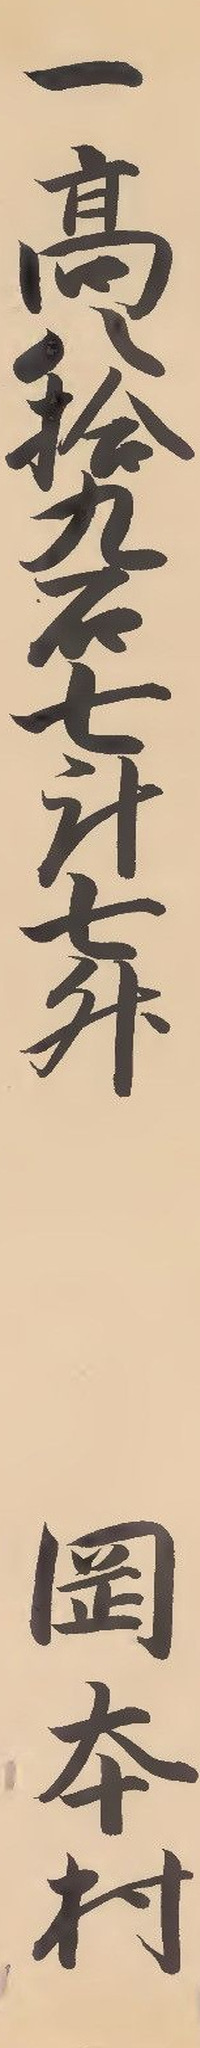一高八拾九石七斗七升岡本村
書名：摂津国郷帳
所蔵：国立公文書館 National Archives of Japan
